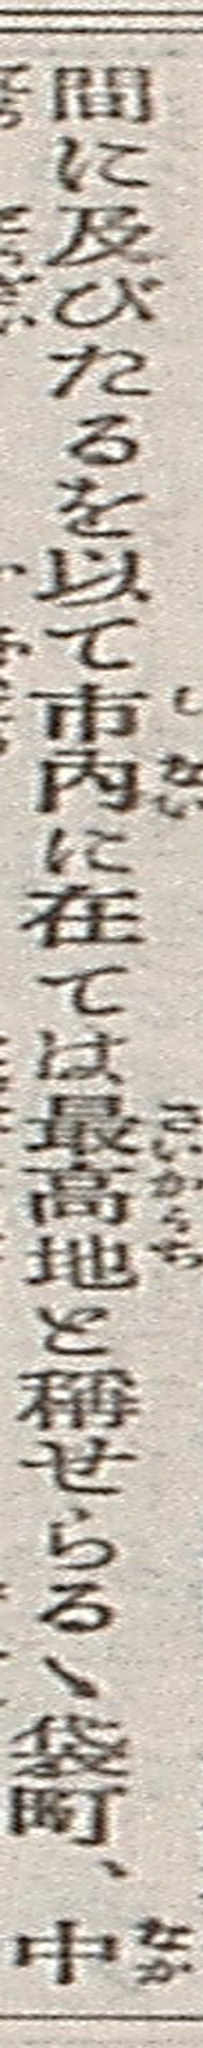間に及びたるを以て市内に在ては最高地と称せらるゝ袋町、中
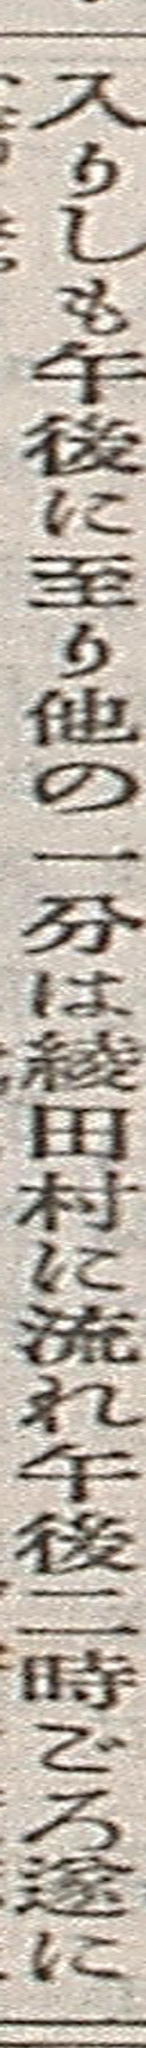入りしも午後に至り他の一分は綾田村に流れ午後二時ごろ遂に
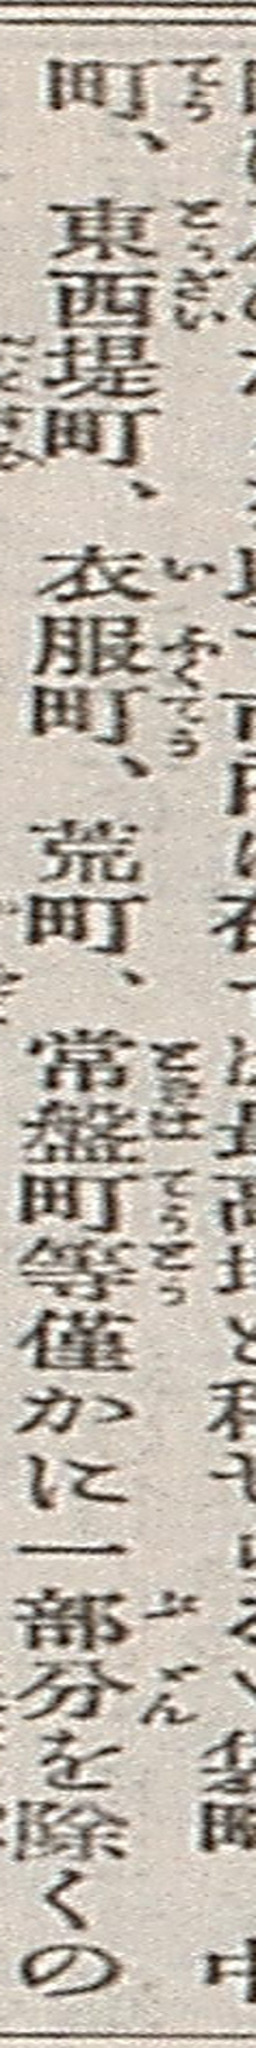町、東西堤町、衣服町、荒町、常磐町等僅かに一部分を除くの
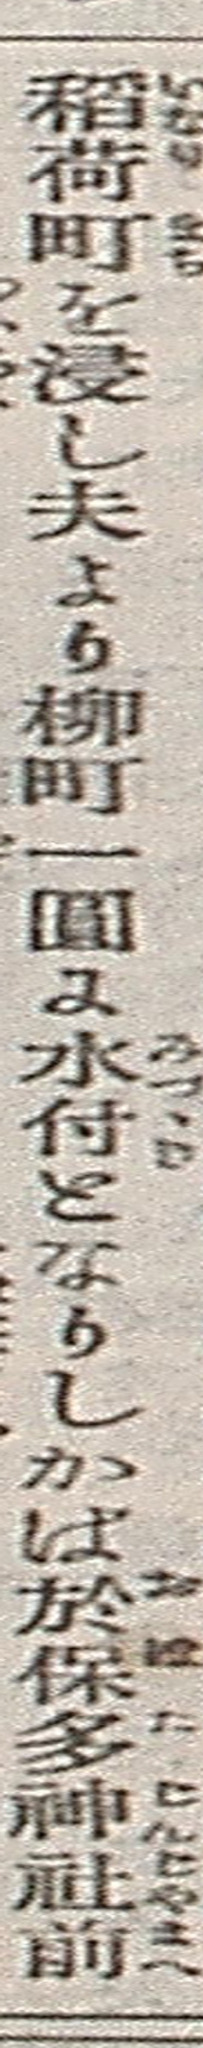稲荷町を浸し夫より柳町一円に水付となりしかば於保多神社前
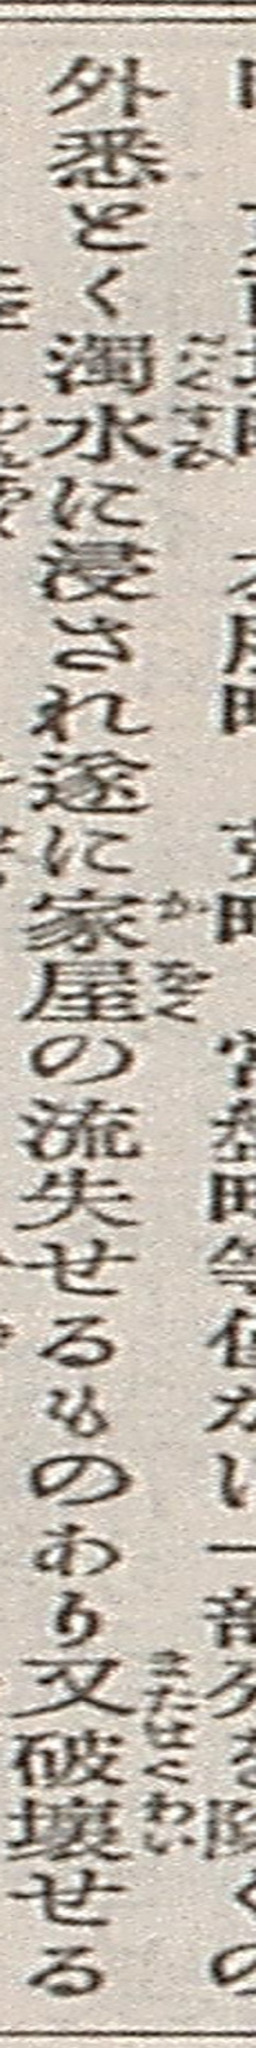外悉とく濁水に浸され遂に家屋の流失せるものあり又破壊せる
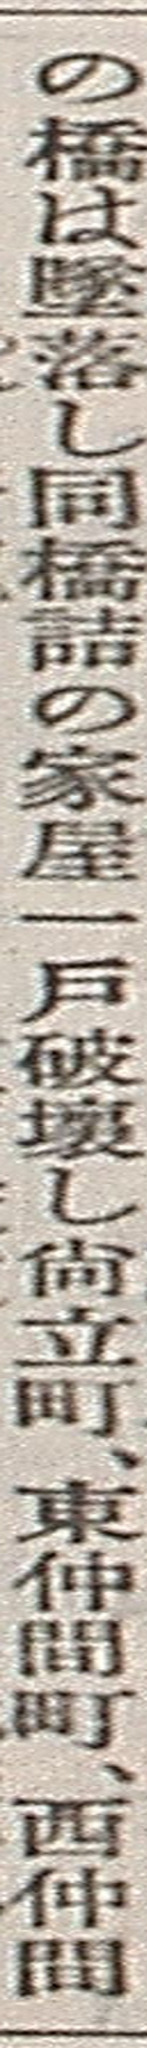の橋は墜落し同橋詰の家屋一戸破壊し尚立町、東仲間町、西仲間
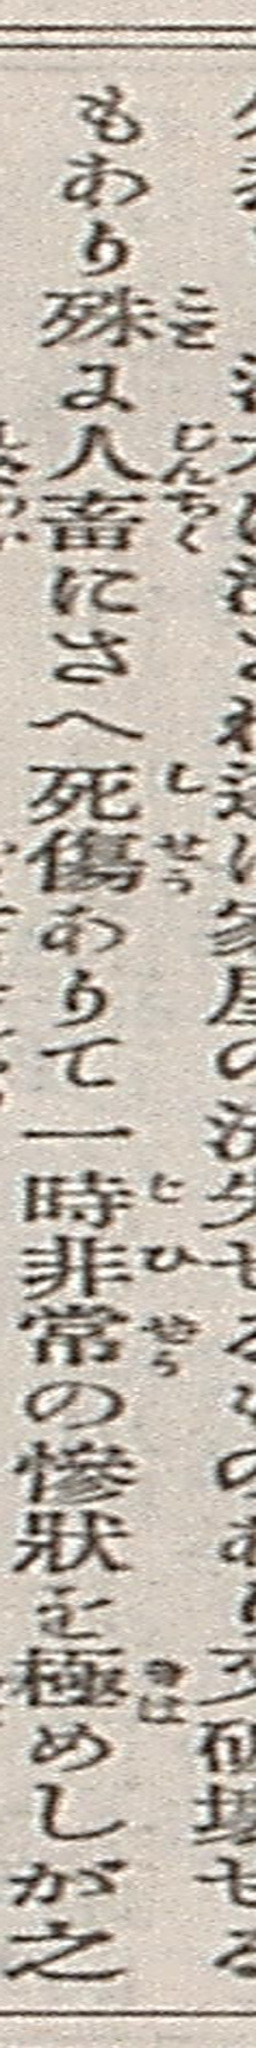もあり殊に人畜にさへ死傷ありて一時非常の惨状を極めしが之
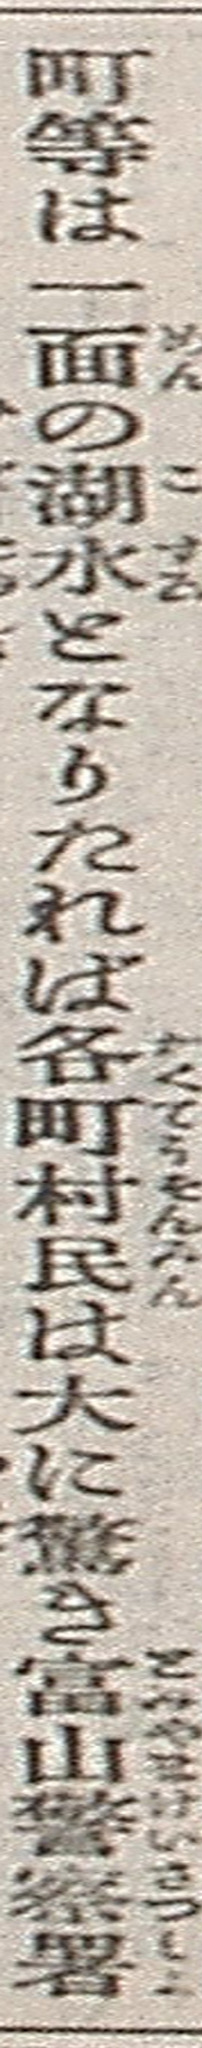町等は一面の湖水となりたれば各町村民は大に驚き富山警察署
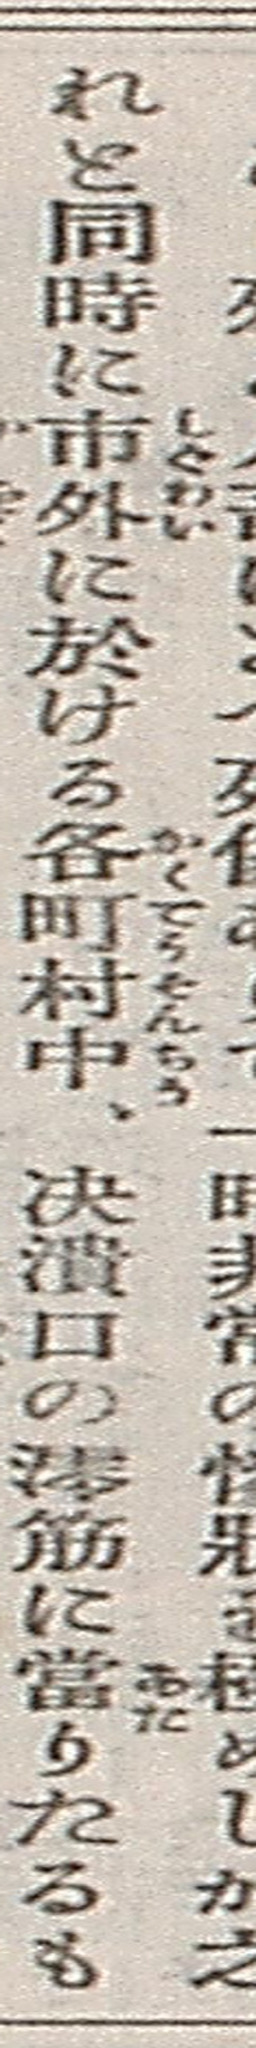れと同時に市外に於ける各町村中、决潰口の澪筋に当りたるも
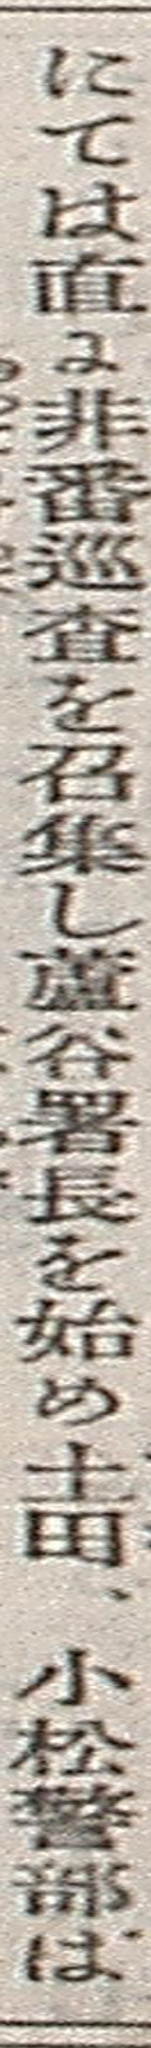にては直に非番巡査を招集し蘆谷署長を始め土田、小松警部は
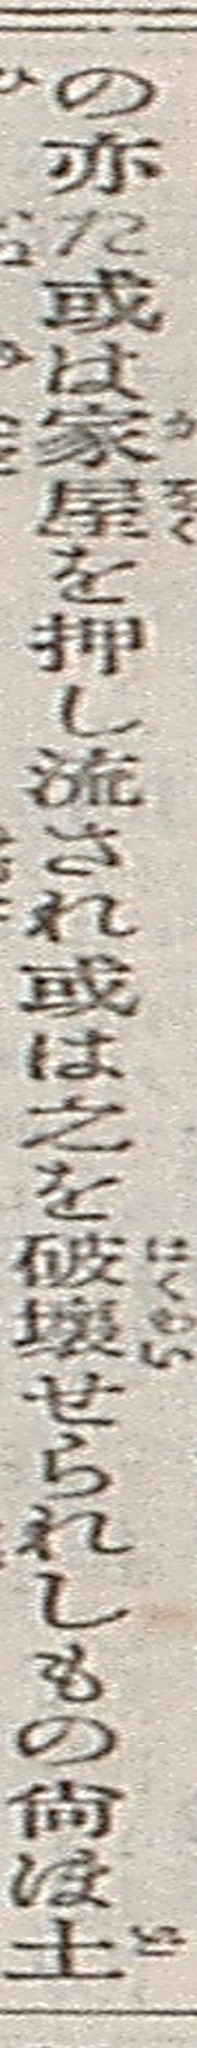の亦た或は家屋を押し流され或は之を破壊せられしもの尚ほ土
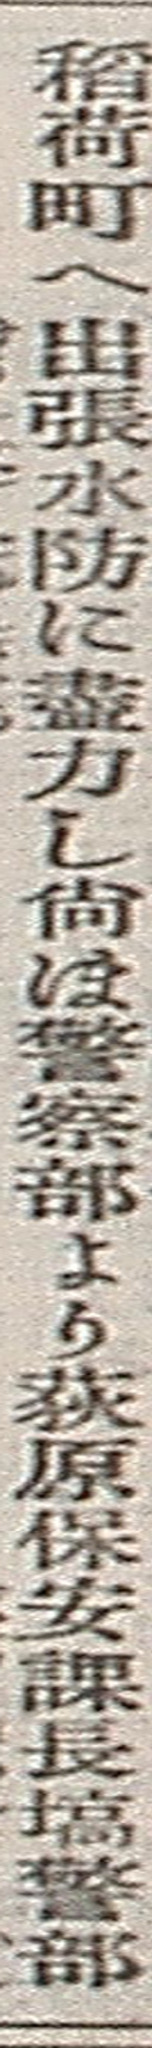稲荷町へ出張水防に尽力し尚ほ警察部より萩原保安課長塙警部
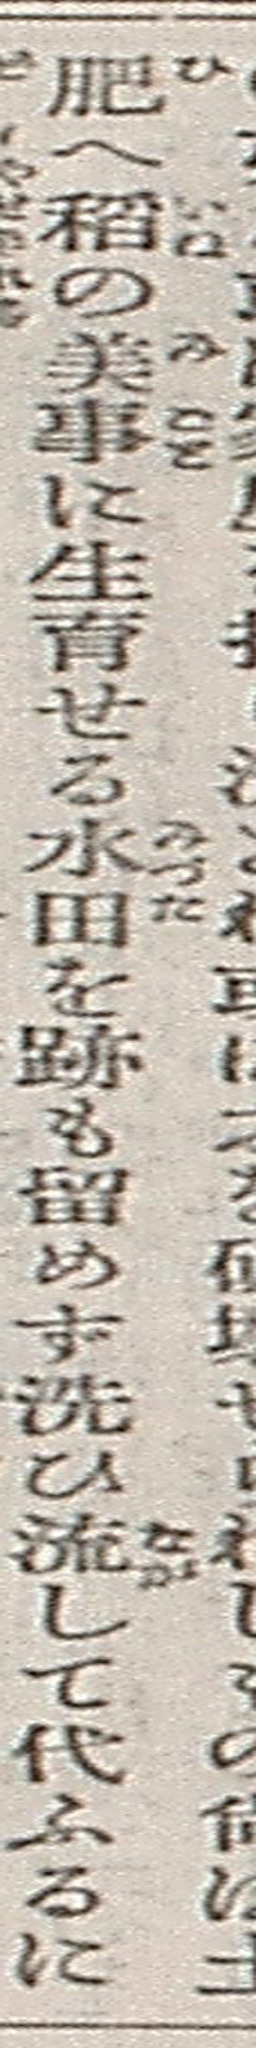肥へ稲の美事に生育せる水田を跡も留めず洗ひ流して代ふるに
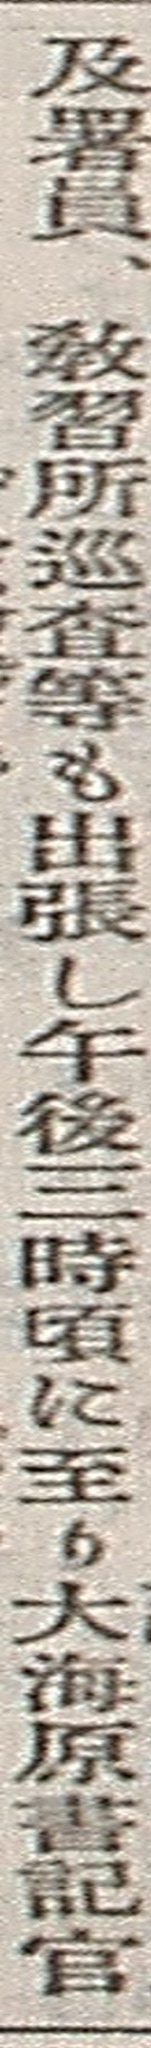及署員、教習所巡査等も出張し午後三時頃に至り大海原書記官
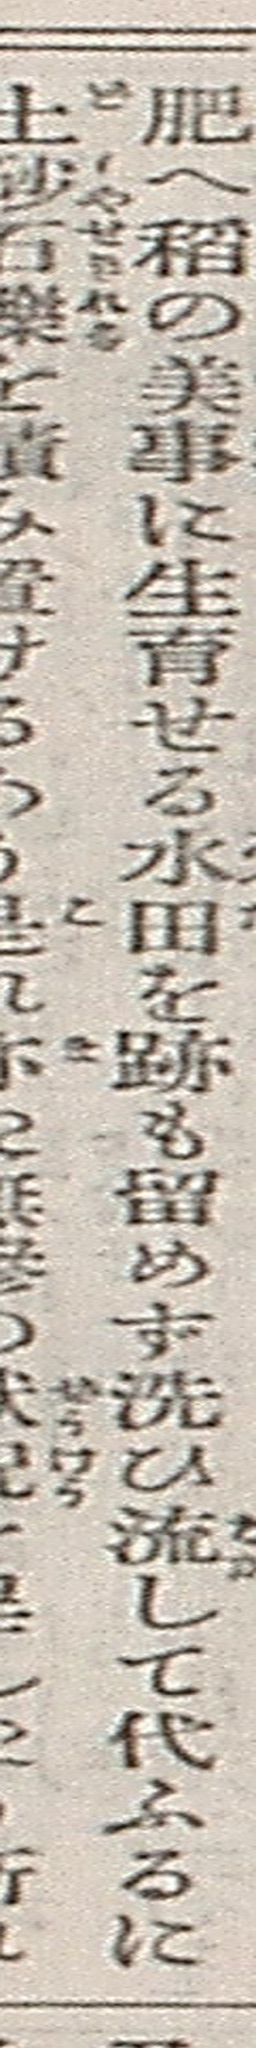土砂石礫を積み置けるあり是れ亦た無惨の状況を呈したり斯れ
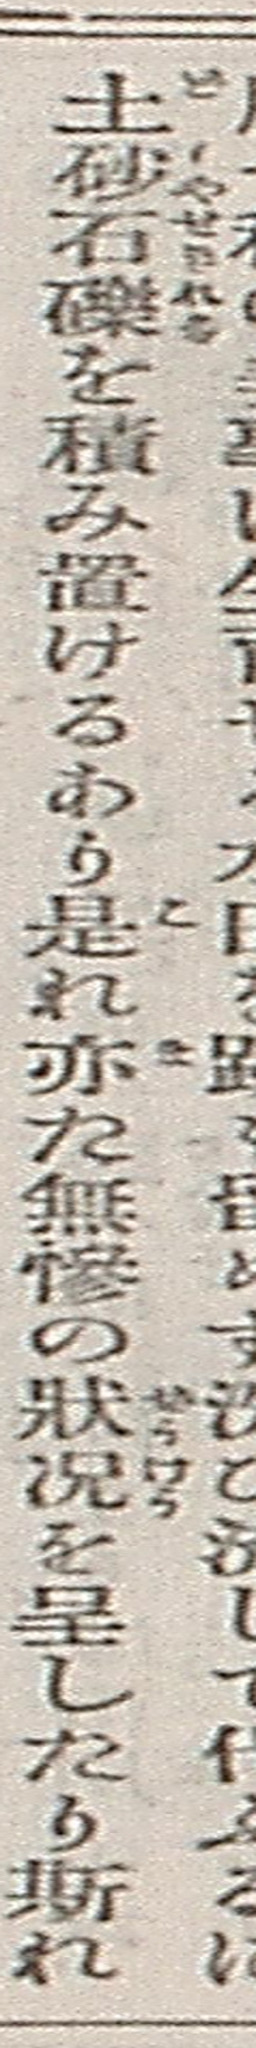土砂石礫を積み置けるあり是れ亦た無惨の状況を呈したり斯れ
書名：風俗畫報臨時増刊第百二十八號　洪水被害録（下）
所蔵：東京大学地震研究所図書室 Earthquake Research Institute Library, The University of Tokyo, JAPAN
